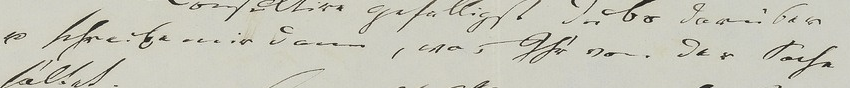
& schreibe mir dann, was Ihr von der Sache
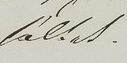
haltet.
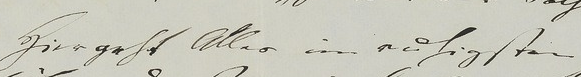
Hier geht Alles im ruhigsten
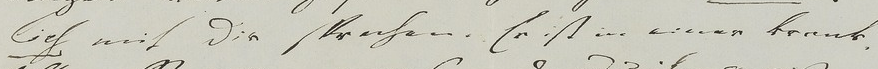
lich mit Dir sprechen. Er ist in einer krank-
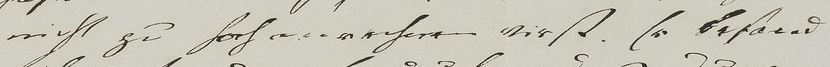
nicht zu hoch anrechnen wirst. Er befand
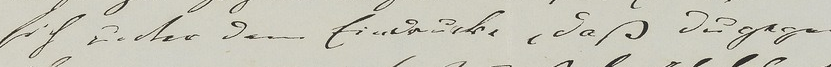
sich unter dem Eindrucke, daß Du gegen
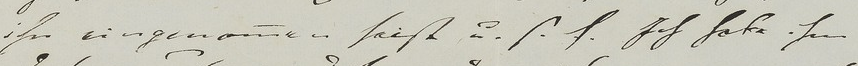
ihn eingenommen seist u. s. f. Ich habe ihm
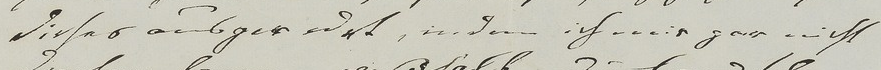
dieses ausgeredet, in dem ich mir gar nicht
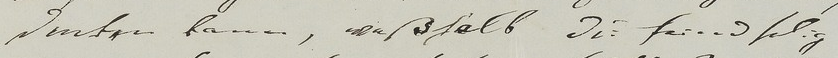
denken kann, weßhalb Du feindselig
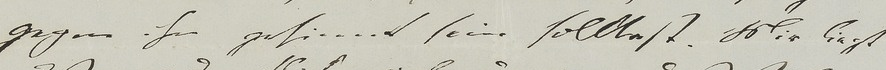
gegen ihn gesinnt sein solltest. Mir liegt
